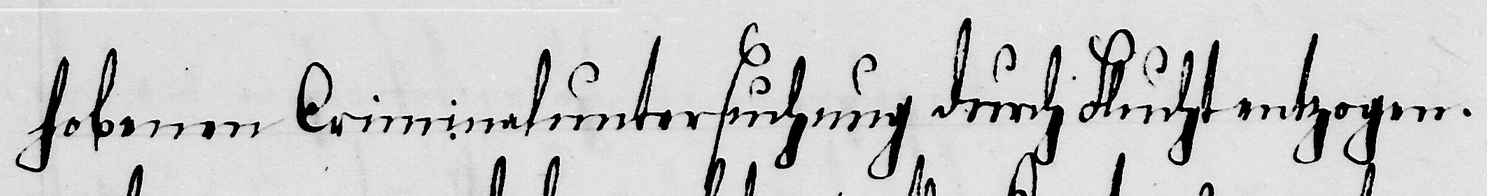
hobenen Criminaluntersuchung durch Flucht entzogen.
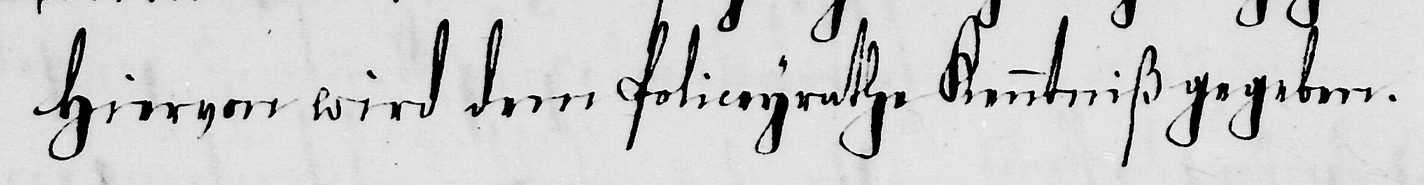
Hiervon wird dem Policeyrathe Kenntniß gegeben.
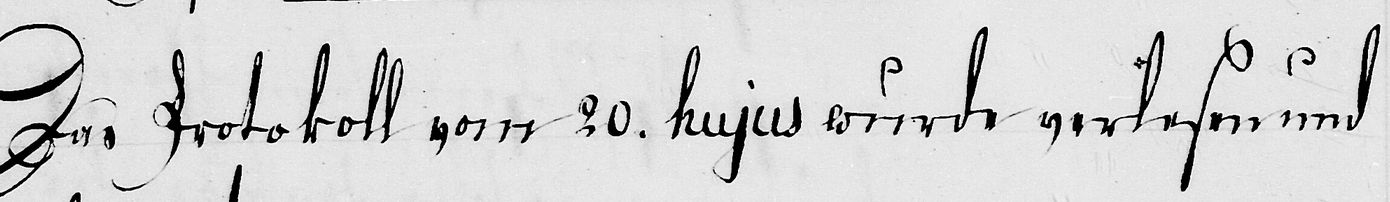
Das Protokoll vom 20. hujus wurde verlesen und
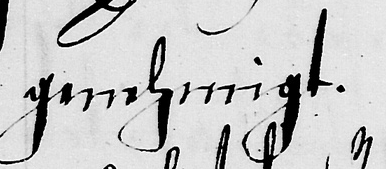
genehmigt.
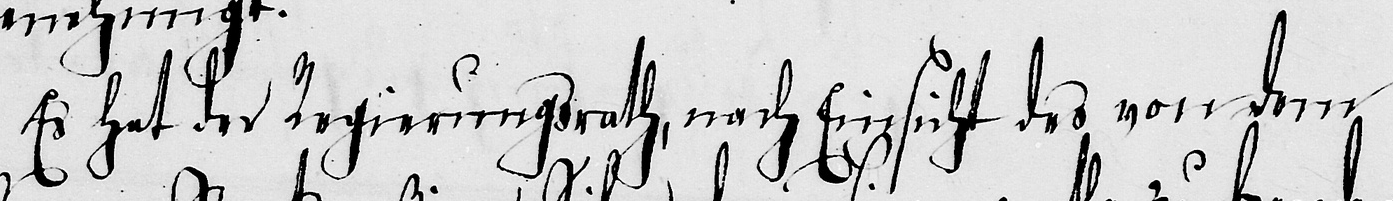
Es hat der Regierungsrath, nach Einsicht des von dem
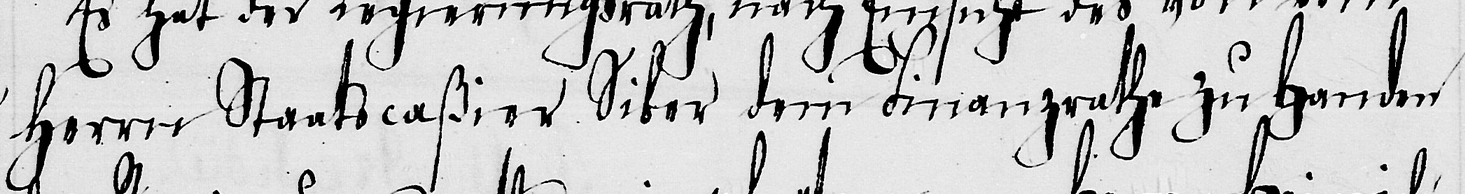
Herrn Staatscaßier Siber dem Finanzrathe zu Handen
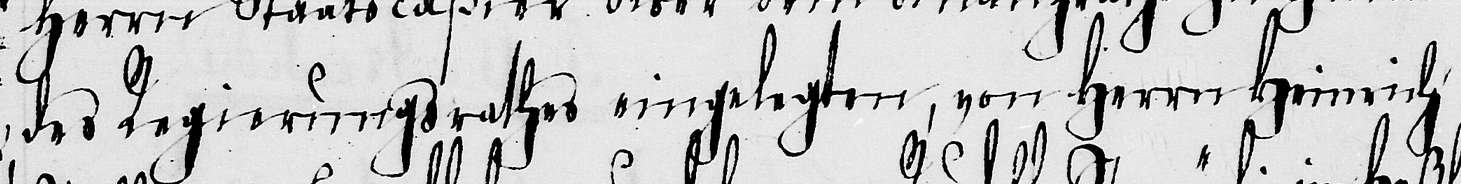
des Regierungsrathes eingelegten, von Herrn Heinrich
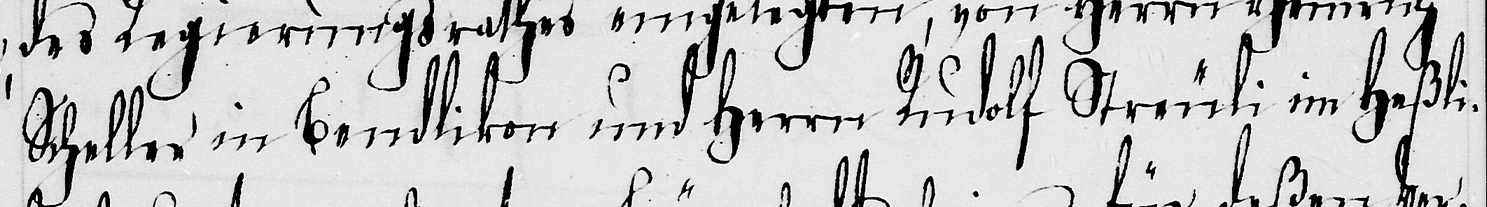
heller in Bendlikon und Herrn Rudolf Streuli im Heßli¬
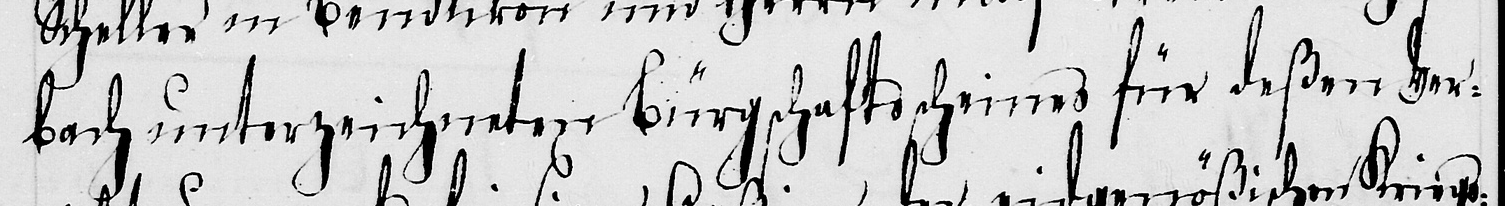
bach unterzeichneten Bürgschaftsscheines für deßen Ver¬
